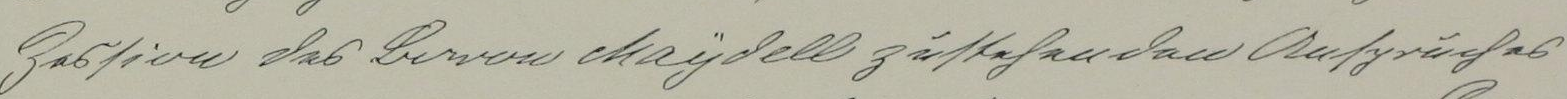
Zession des Baron Maydell zustehenden Anspruches
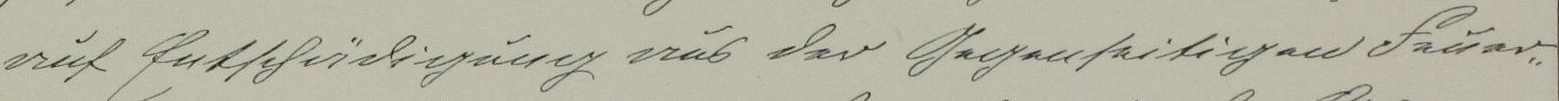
auf Entschädigung aus der Gegenseitigen Feuer-
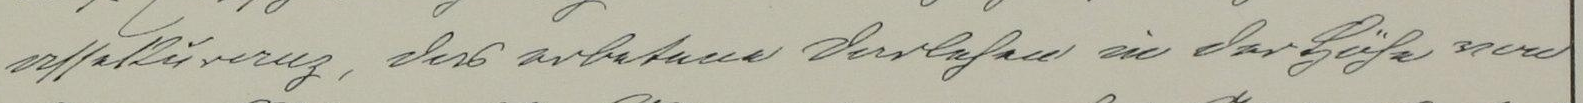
assekuranz, das erbetene Darlehen in der Höhe von
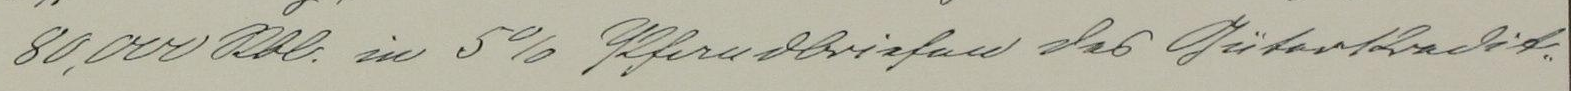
80.000 Rbl. in 5% Pfandbriefen des Güterkredit-
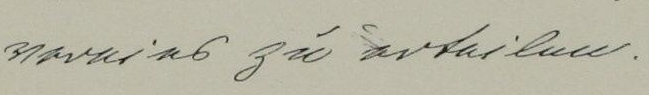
vereins zu erteilen.
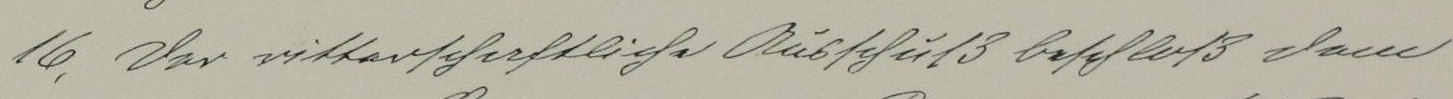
16. Der ritterschaftliche Ausschuß beschloß dem
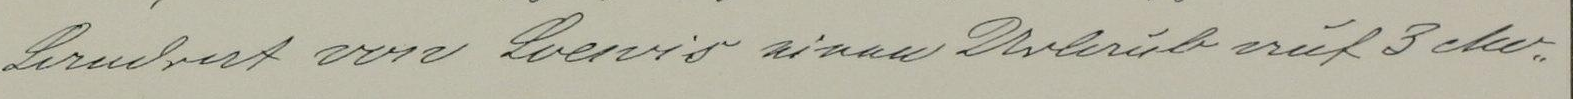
Landrat von Loewis einen Urlaub auf 3 Mo-
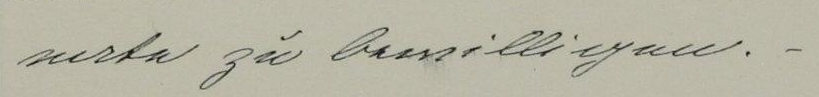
nate zu bewilligen.
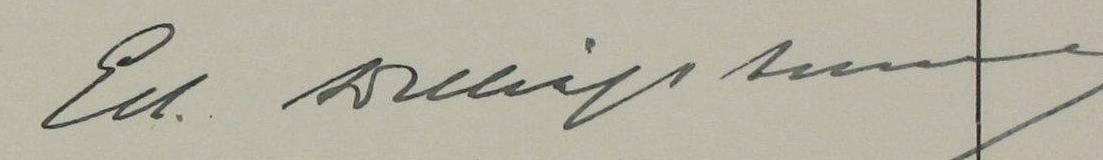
Ed. Dellingshausen
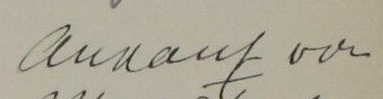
Ankauf von
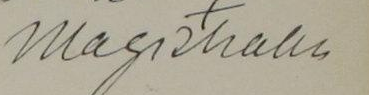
Magistralen
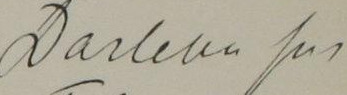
Darlehn für
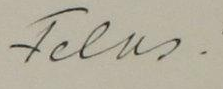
Felks
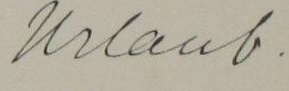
Urlaub
